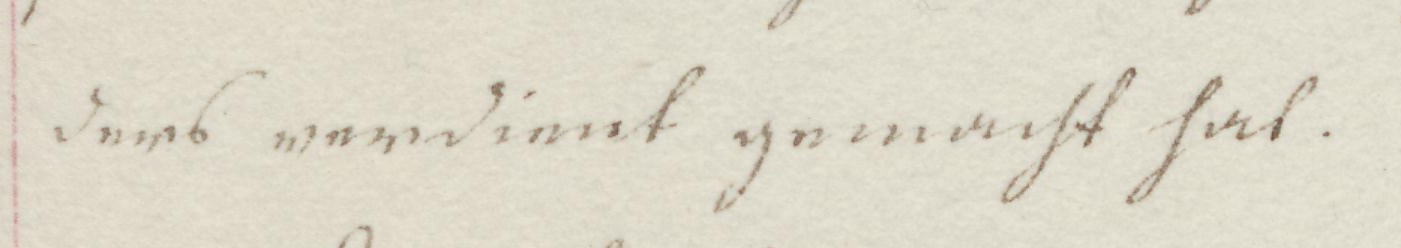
ders verdient gemacht hat.
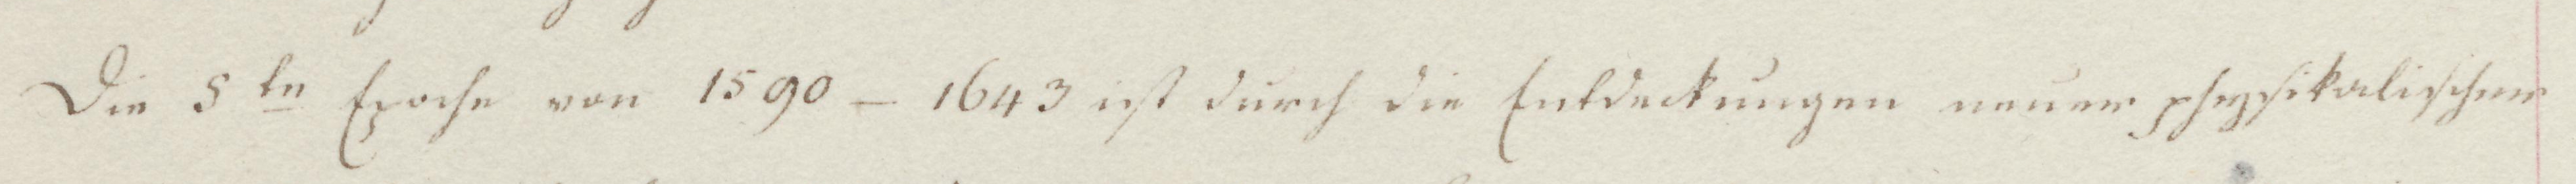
Die 5te Epoche von 1590–1643 ist durch die Entdeckungen neuer physikalischer
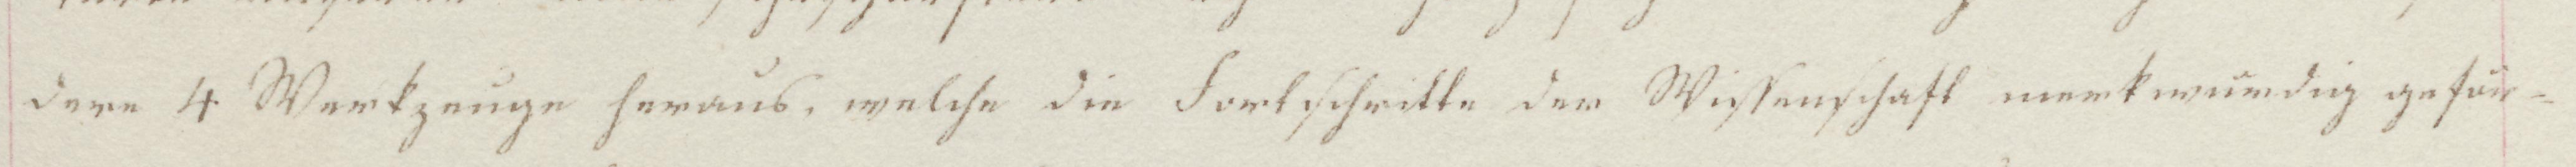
dere 4 Werkzeuge heraus, welche die Fortschritte der Wissenschaft merkwürdig geför-
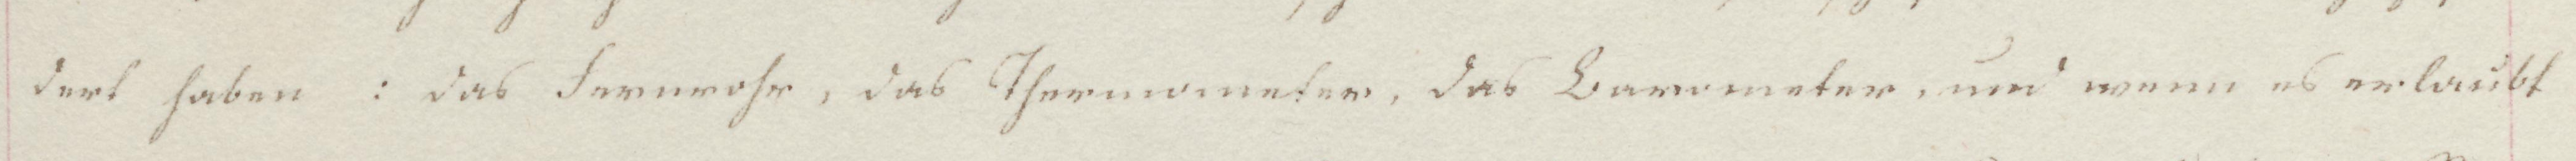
dert haben: das Fernrohr, das Thermometer, das Barometer, und wenn es erlaubt
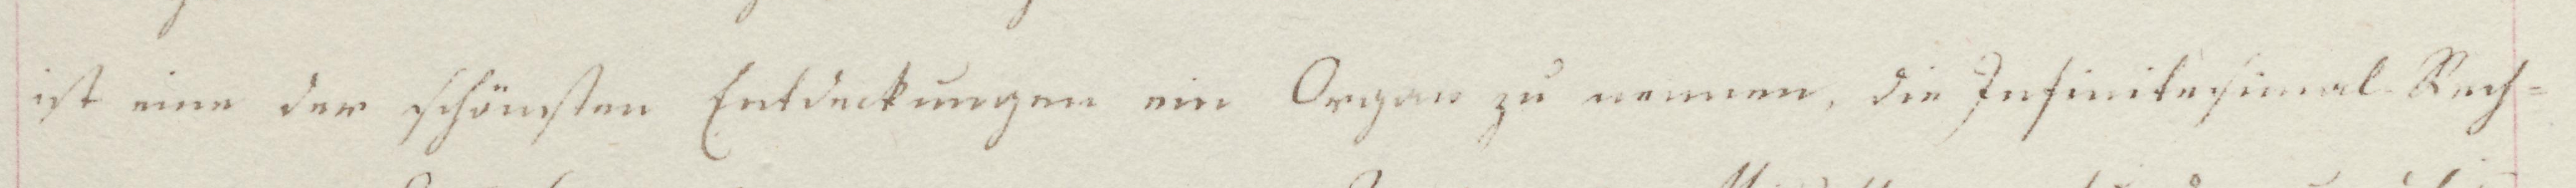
ist eine der schönsten Entdeckungen ein Organ zu nennen, die Infinitesimal-Rech-
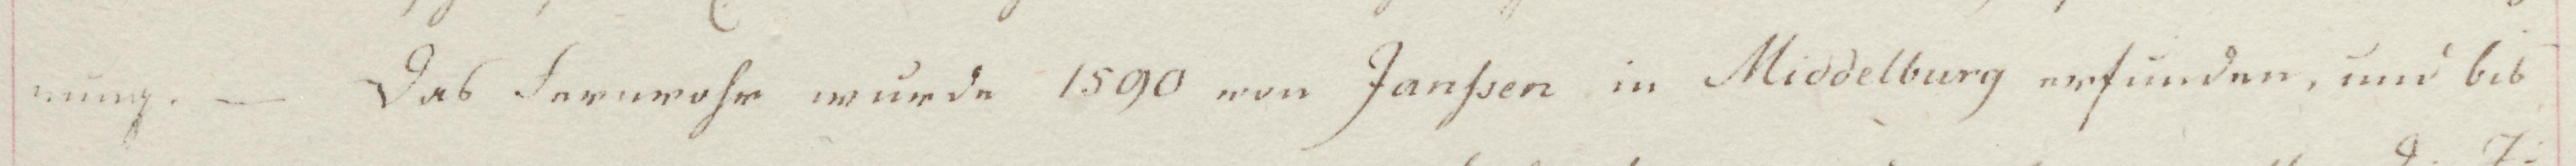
nung. – Das Fernrohr wurde 1590 von Janssen in Middelburg erfunden, und bis
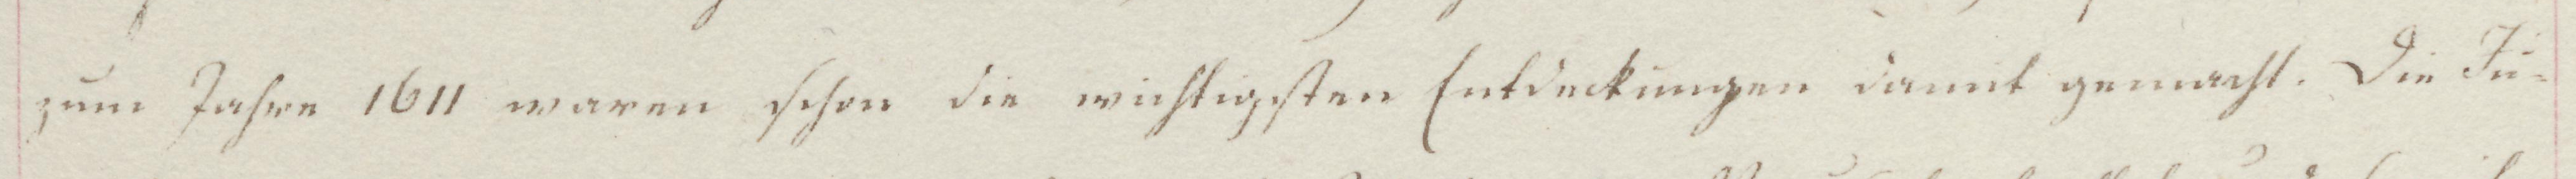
zum Jahre 1611 waren schon die wichtigsten Entdeckungen damit gemacht. Die Ju-
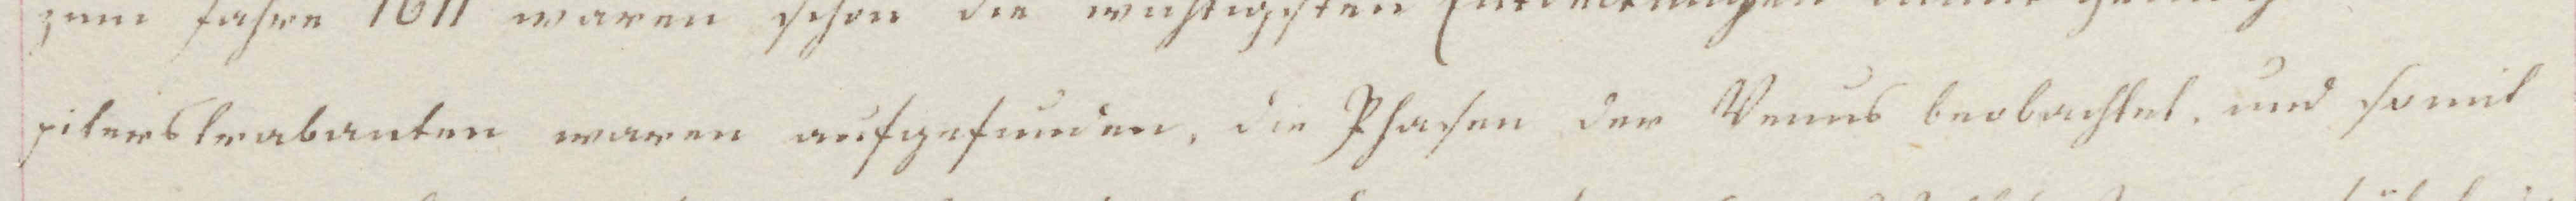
piterstrabanten waren aufgefunden, die Phasen der Venus beobachtet, und somit
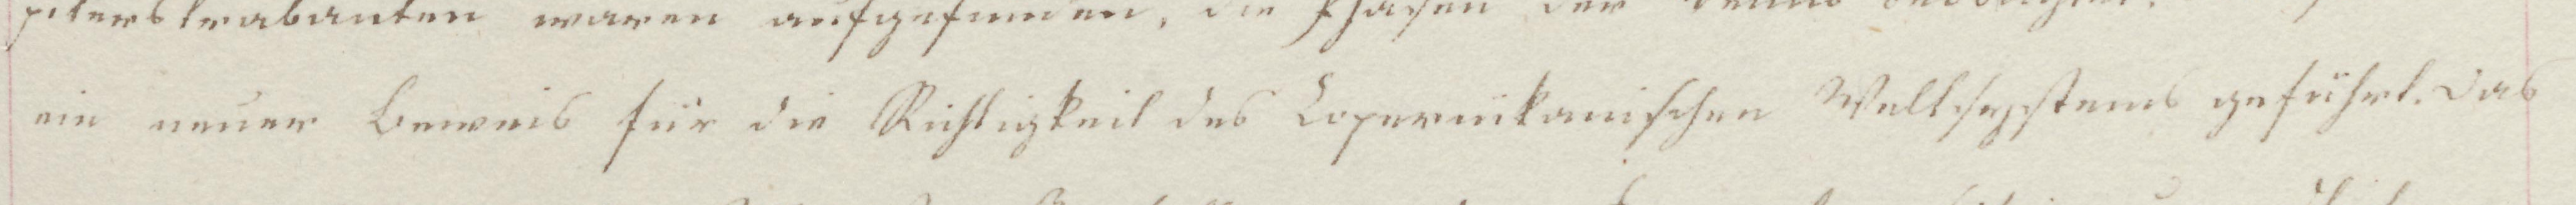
ein neuer Beweis für die Richtigkeit des Copernikanischen Weltsystems geführt. Das
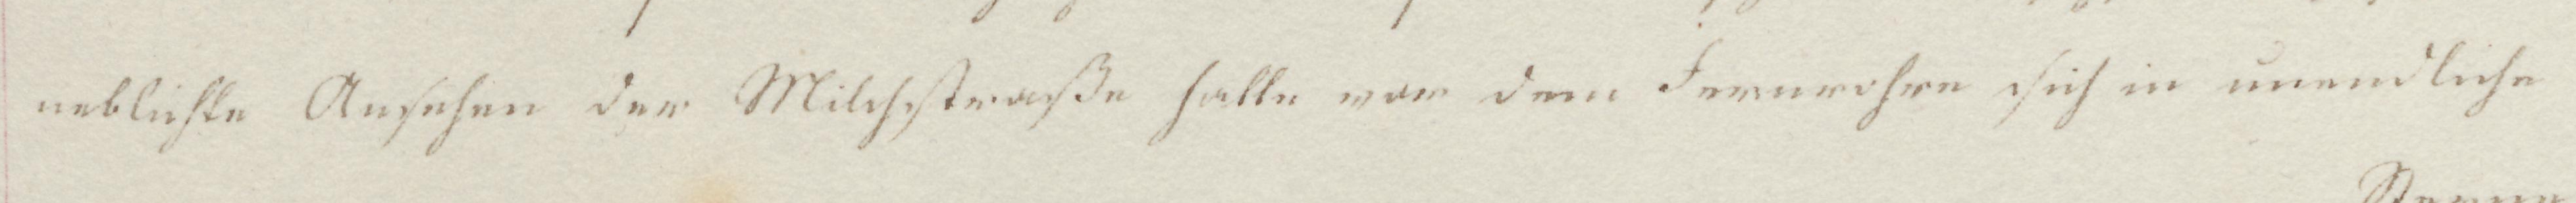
neblichte Ansehen der Milchstraße hatte vor dem Fernrohr sich in unendliche
